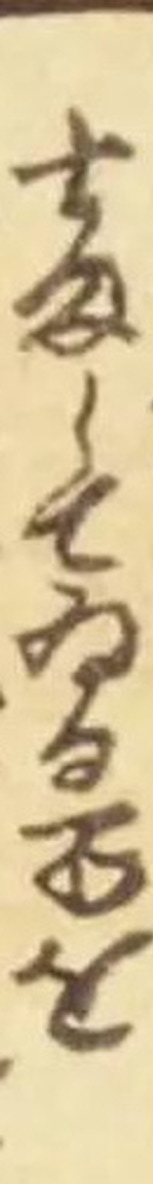すましてゐる所を
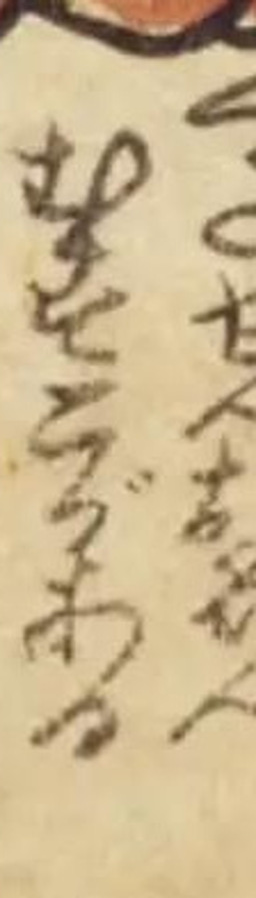むすこがある
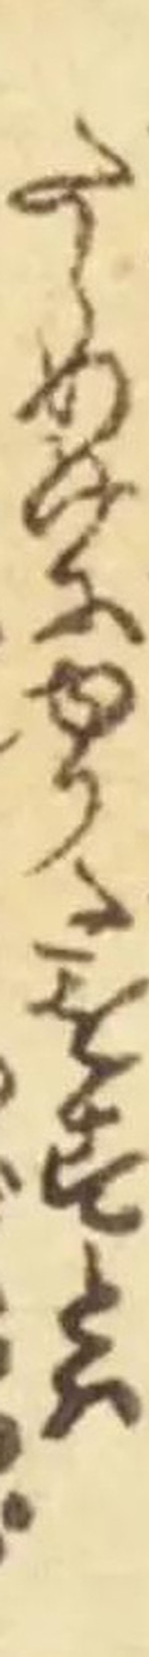たしめけにゆりたをすとは
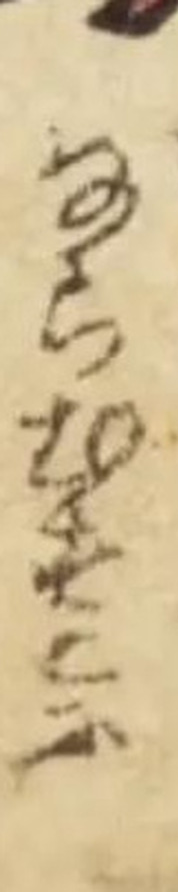ならむすこに
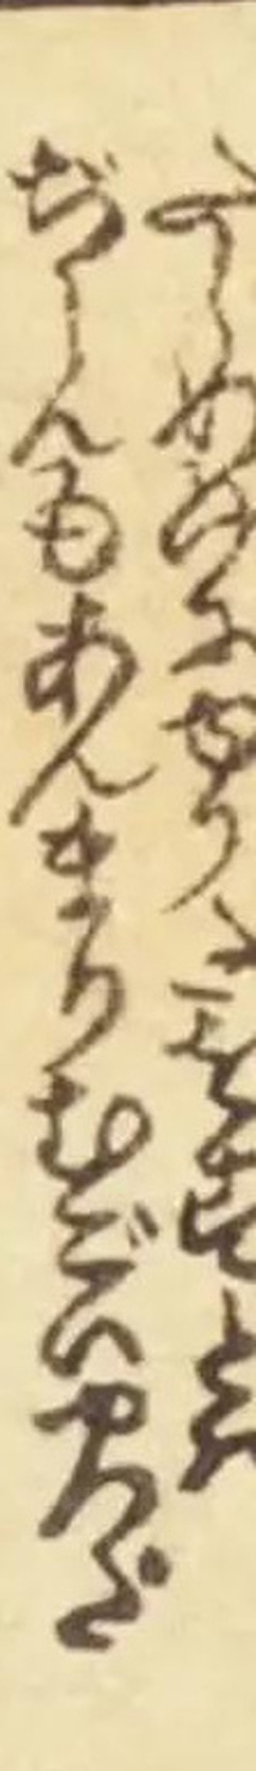ぢしんもあんまりむごいやつだ
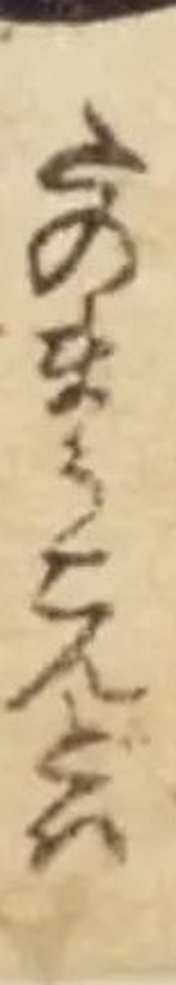たのまうこんどは
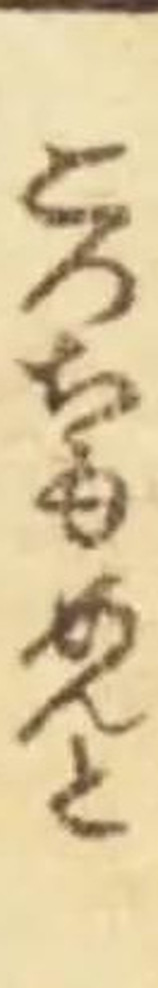こつちもめんと
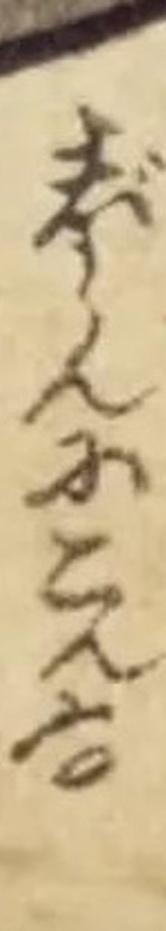じしんにこんな
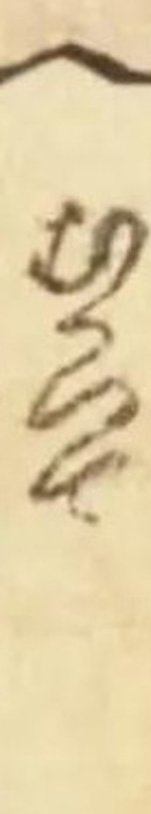むかつて
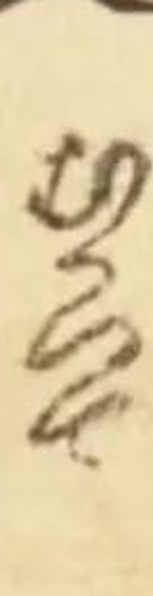むかつて
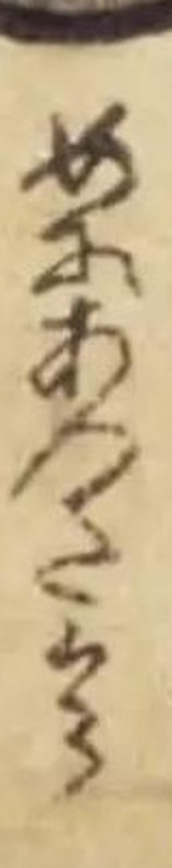めにあつたから
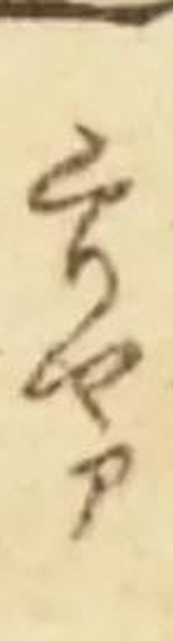くりやア
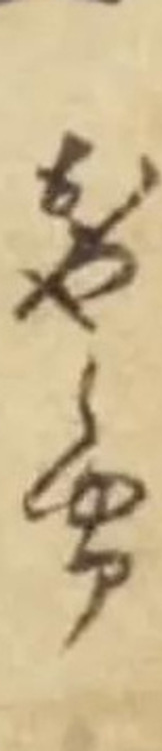おやしやア
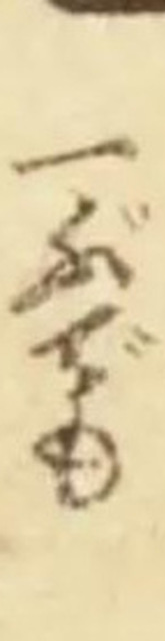一ぶでも
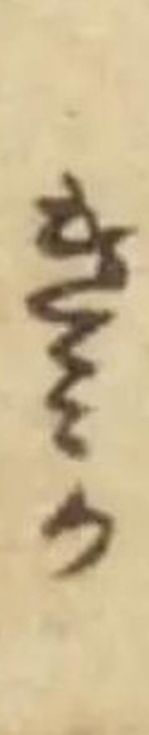きみか
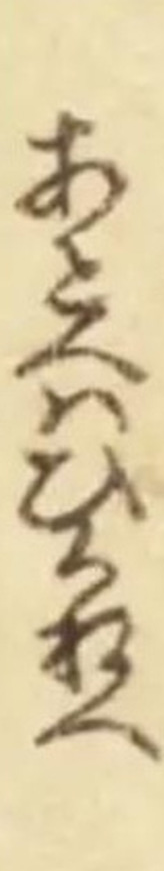あとへはひかねへ
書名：安政二年十月二日地震出火後日角力
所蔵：国立国会図書館 National Diet Library, JAPAN
